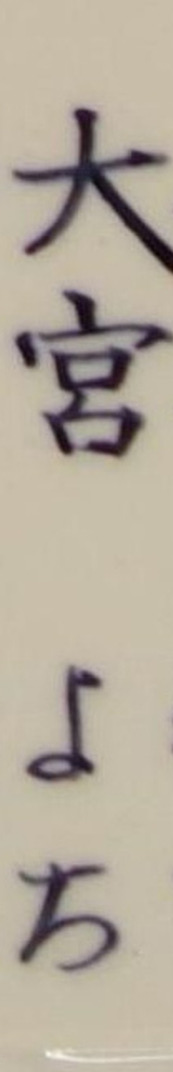大宮よち
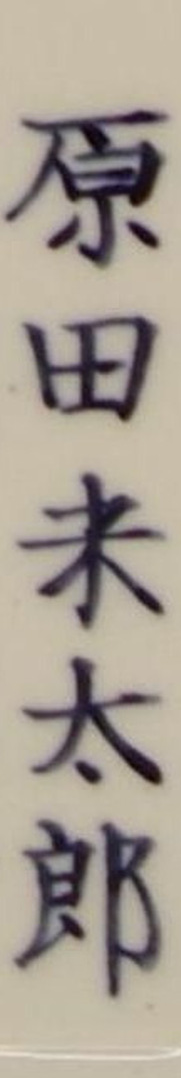原田米太郎
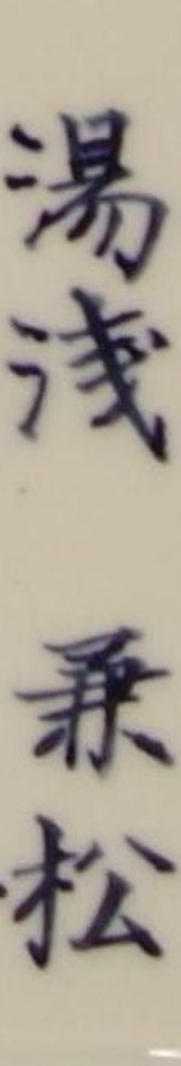湯浅兼松
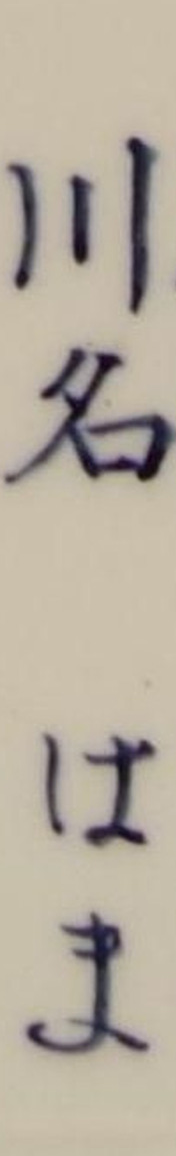川名はま
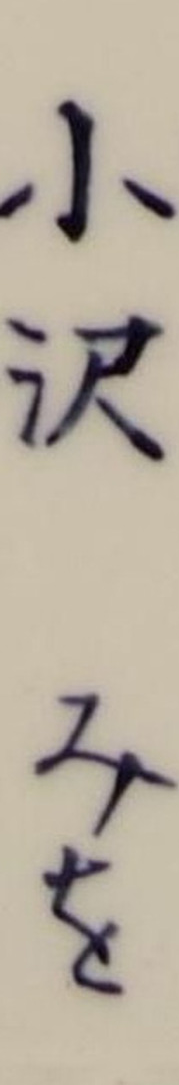小沢みを
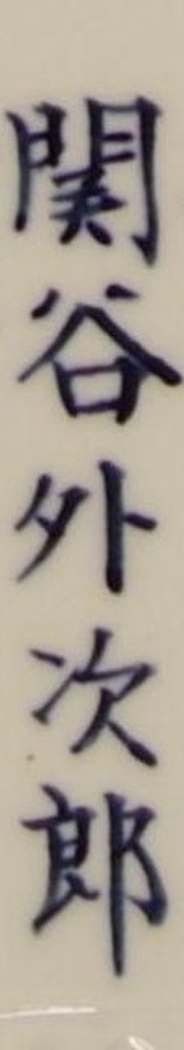関谷外次郎
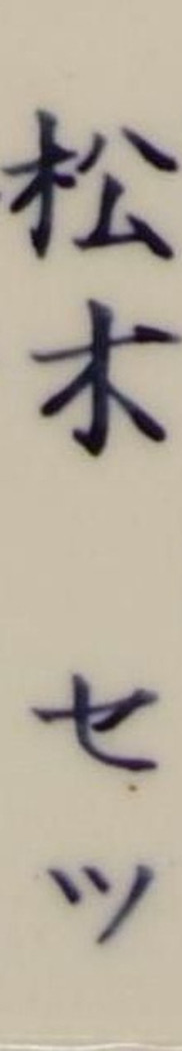松木セツ
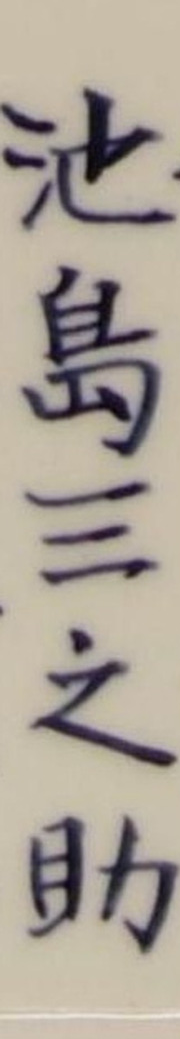池島三之助
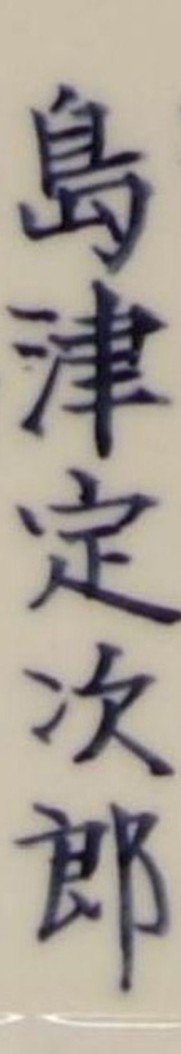島津定次郎
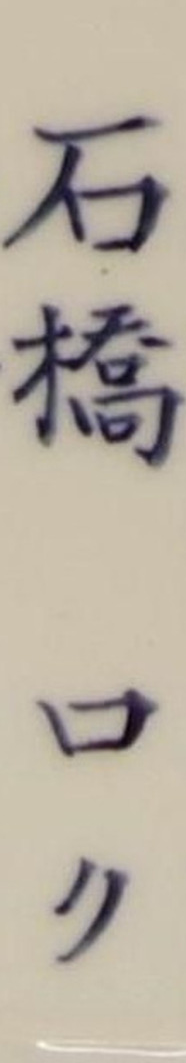石橋ロク
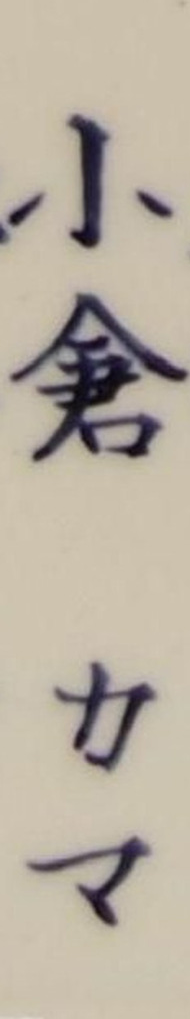小倉カマ
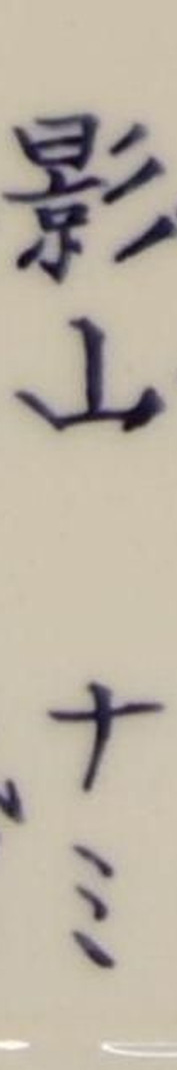影山ナミ
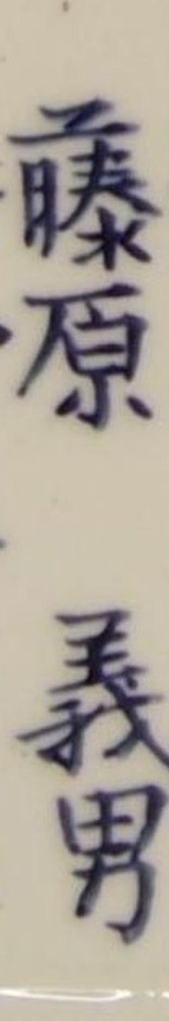藤原義男
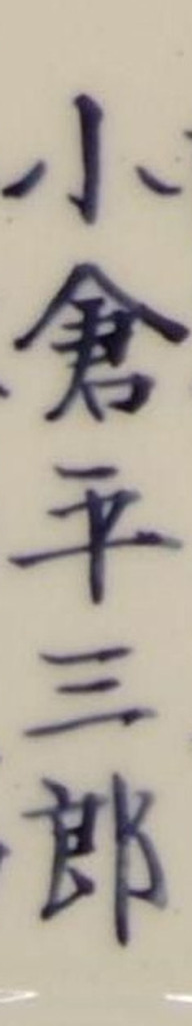小倉平三郎
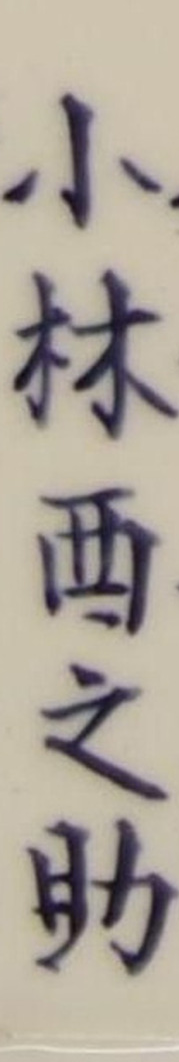小林酉之助
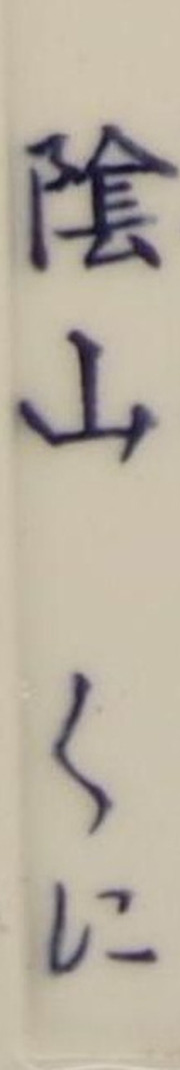陰山くに
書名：M~S
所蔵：高野山金剛峯寺
